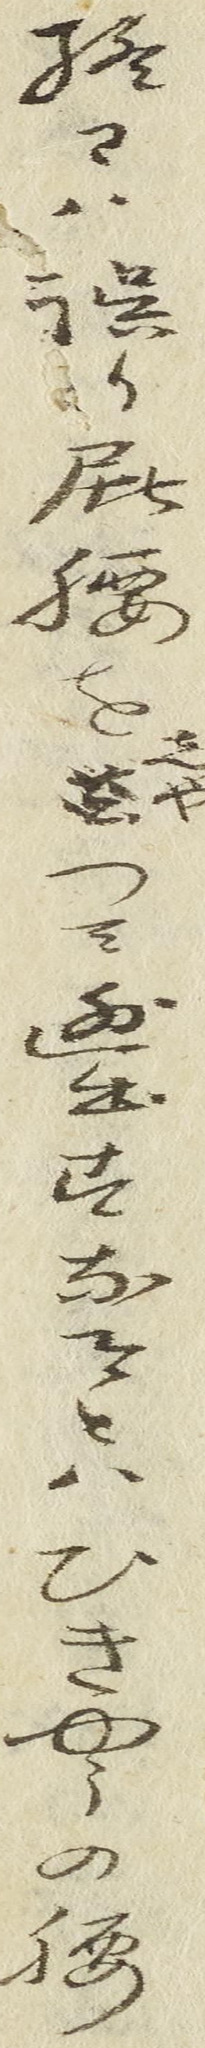終にハ誤り屁腰をしやつて逃出すなそとハひきゆうの腰
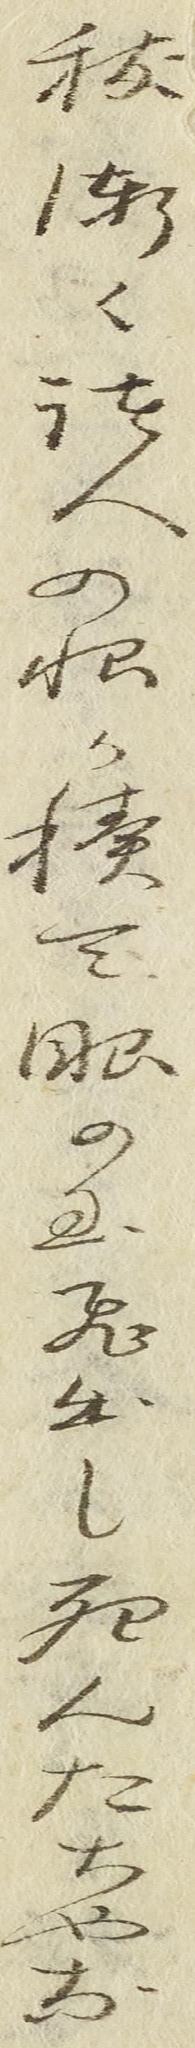抜漸く諸人の恨か積て眼の玉飛出し死んたちやな
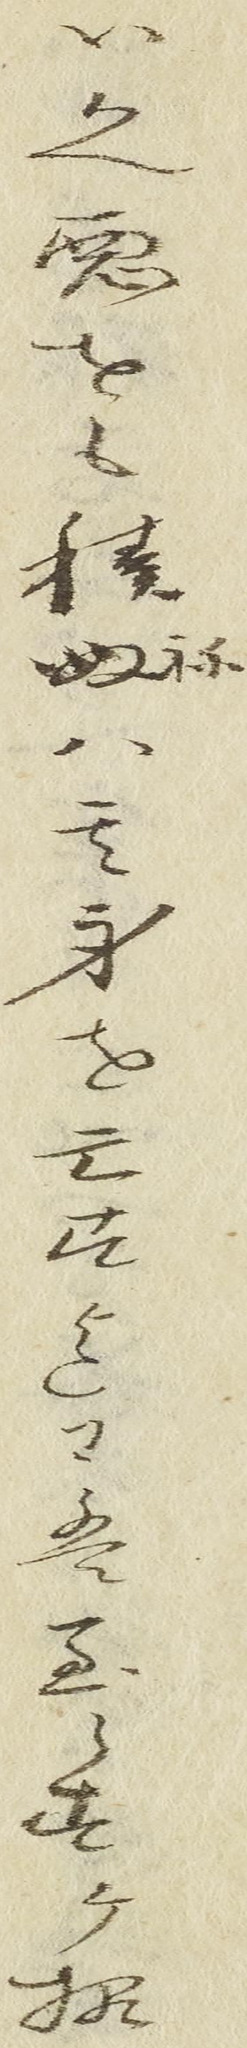いかへ悪をも積ねは其身を亡す迄には至らすケ様
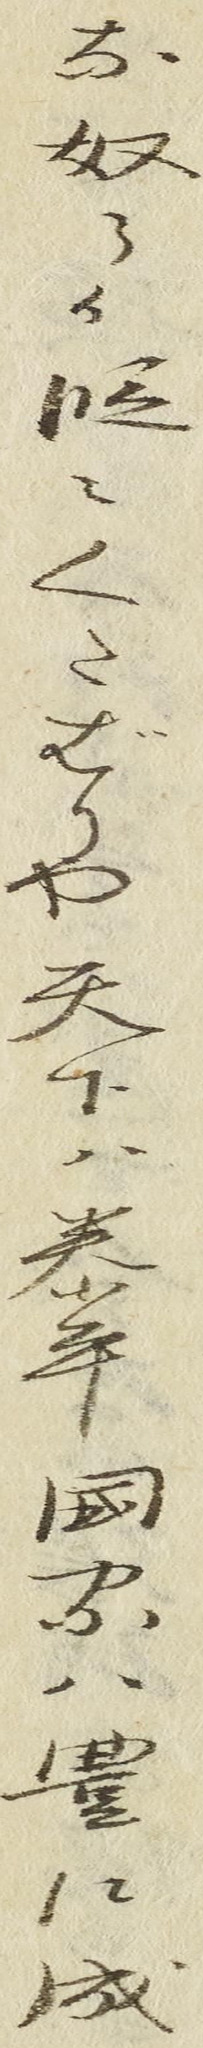奴らか段々くたばりや天下ハ泰平国家は豊に成
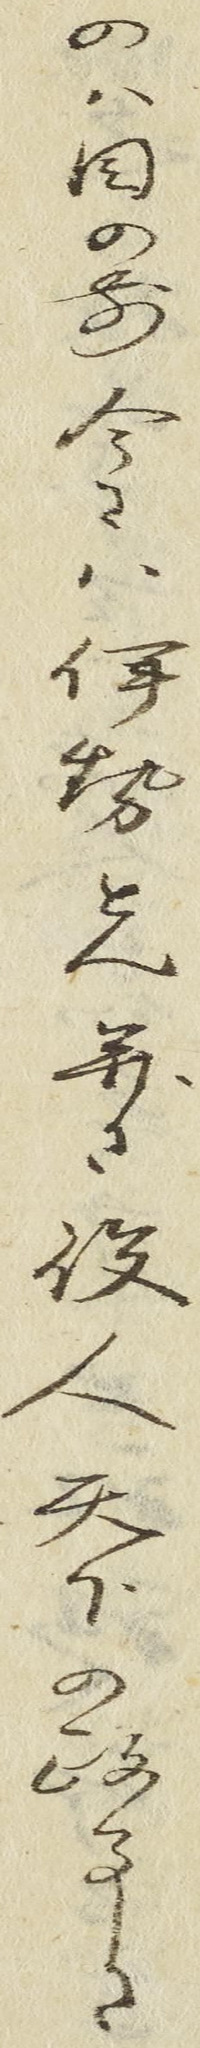のハ目の前今にハ伊勢とん并た役人天下の政事して
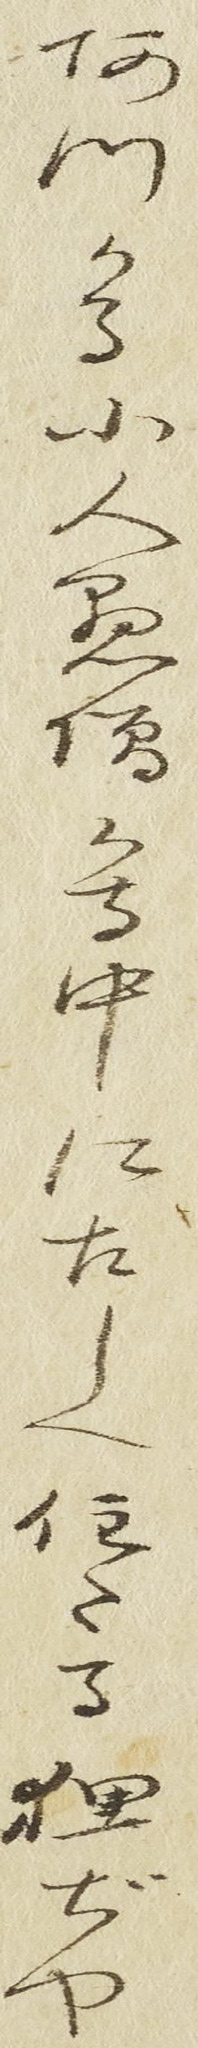あつかる小人悪僧か寺中にたしへ住たる狸ぢや
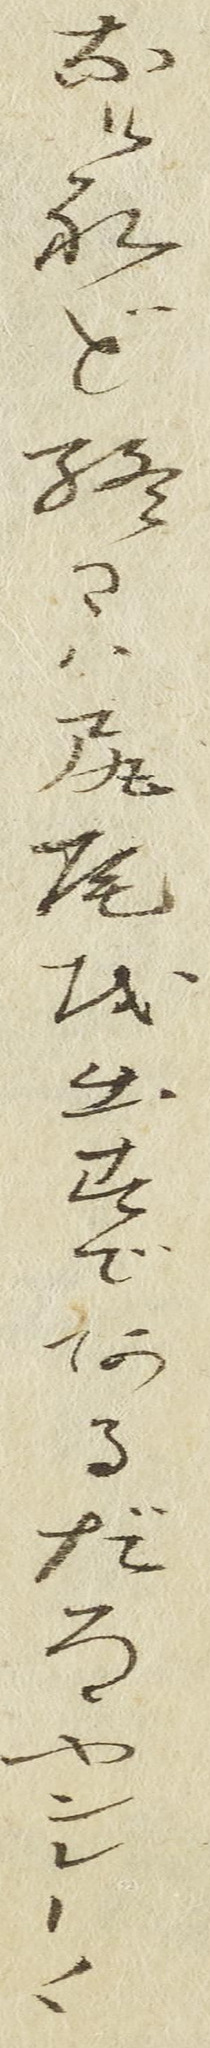なけれど終にハ尻尾を出すであるだろヤンㇾー〳〵
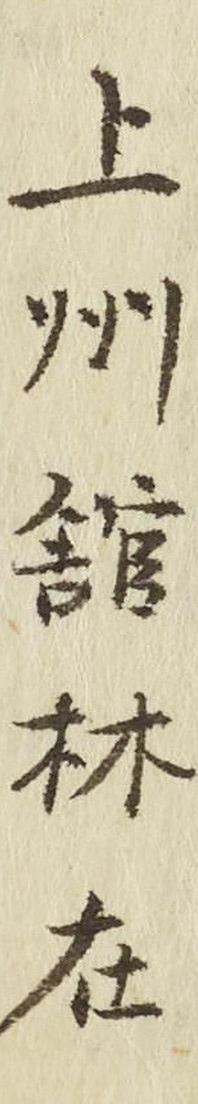上州館林在
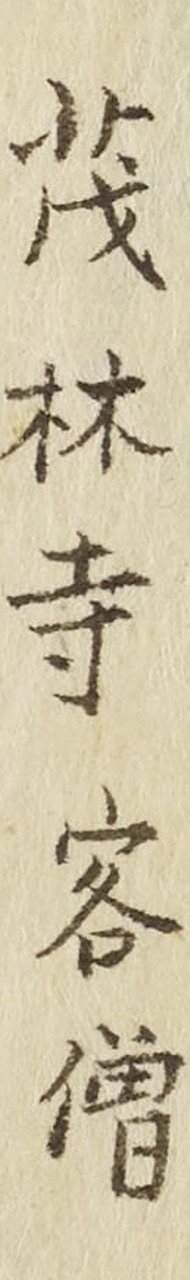茂林寺客僧
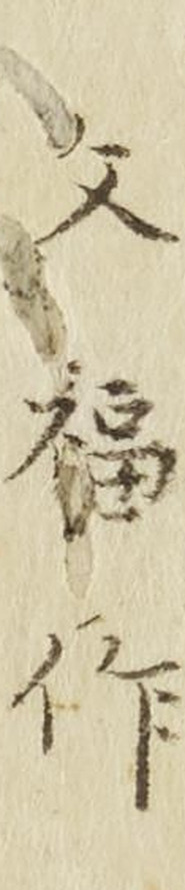父福作

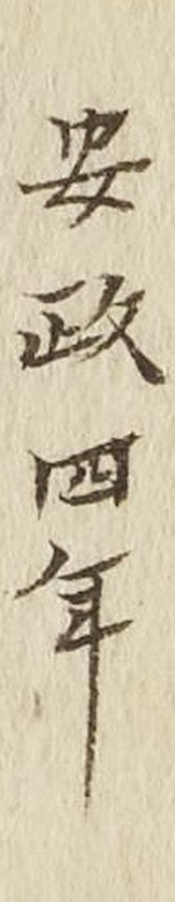安政四年
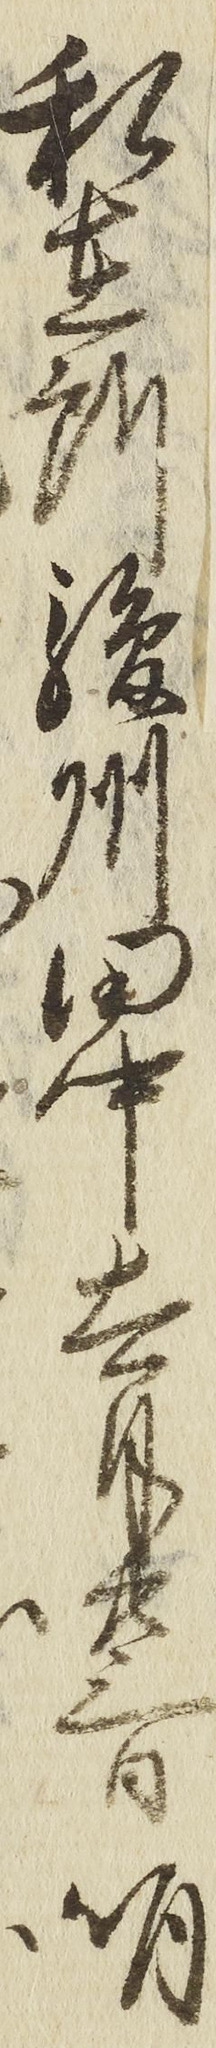私在所駿州田中去月廿三日明
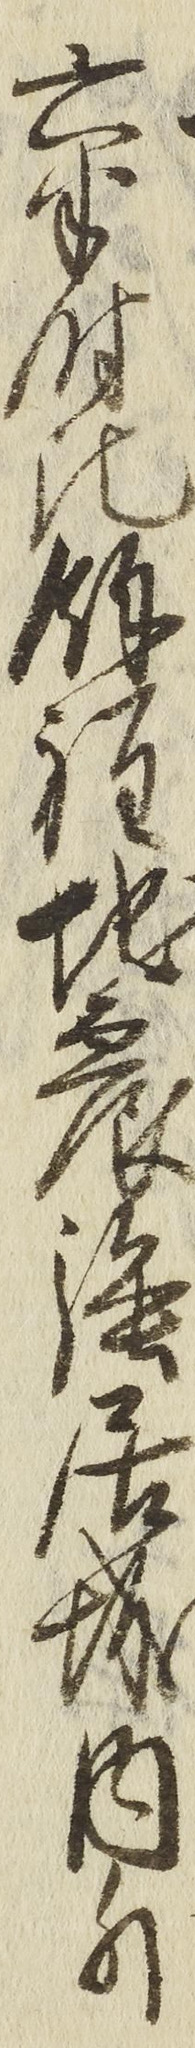六半時比餘程地震強居城内外
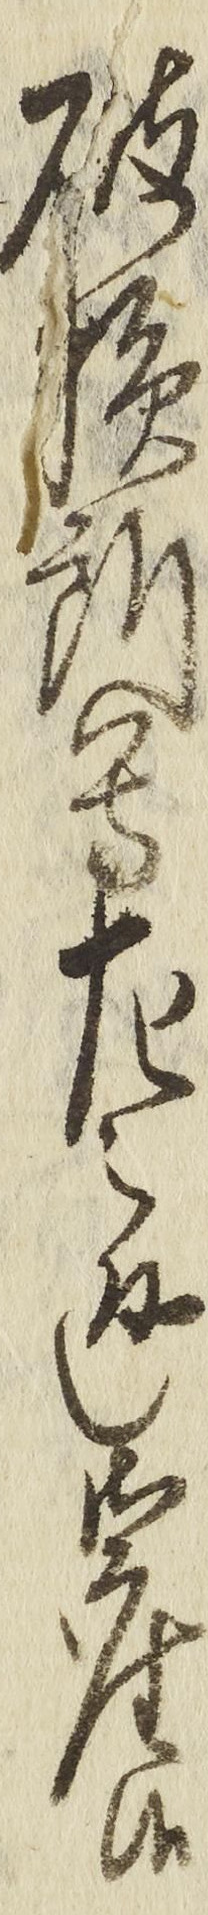破損所等左之通御座候
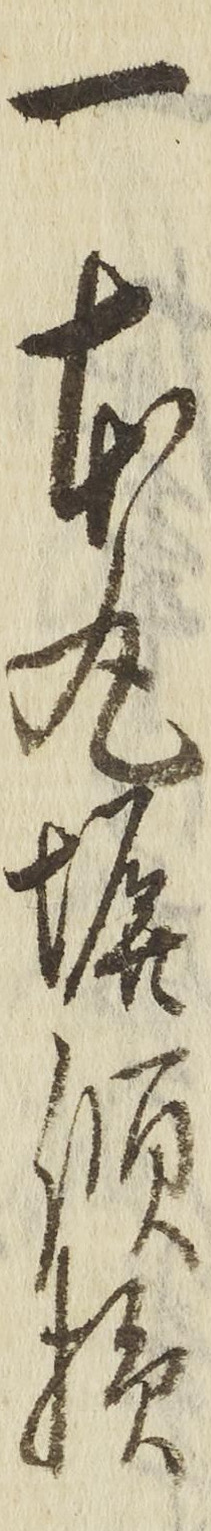一本丸塀傾損
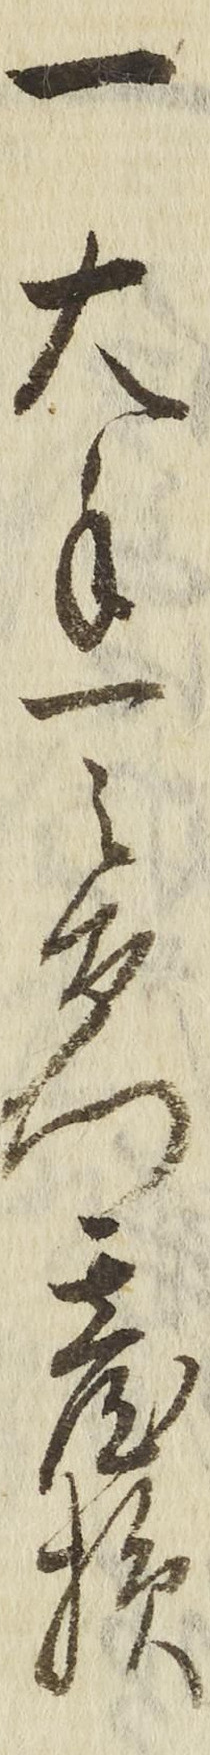一大手一之多門台損
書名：世説ヤンレフシ写、駿州田中城地震ニ付内外破損御届書、豫州大洲城地震ニ付内外破損御届書・封廻状
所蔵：東京大学地震研究所図書室 Earthquake Research Institute Library, The University of Tokyo, JAPAN
